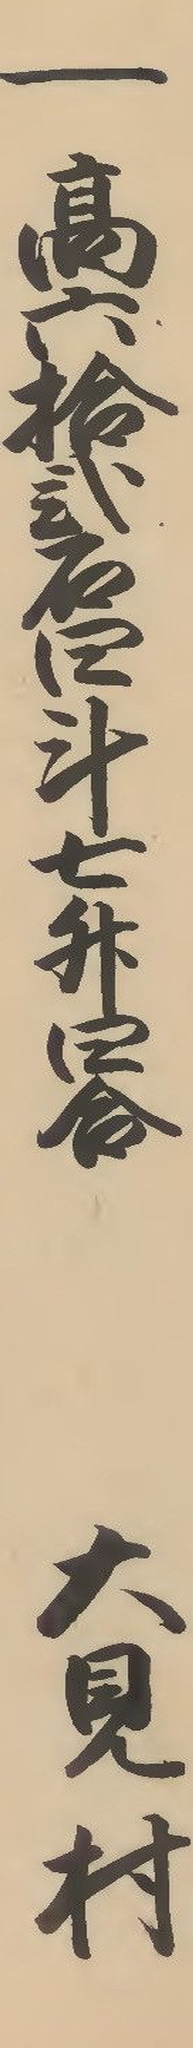一高六拾弐石四斗七升四合大見村
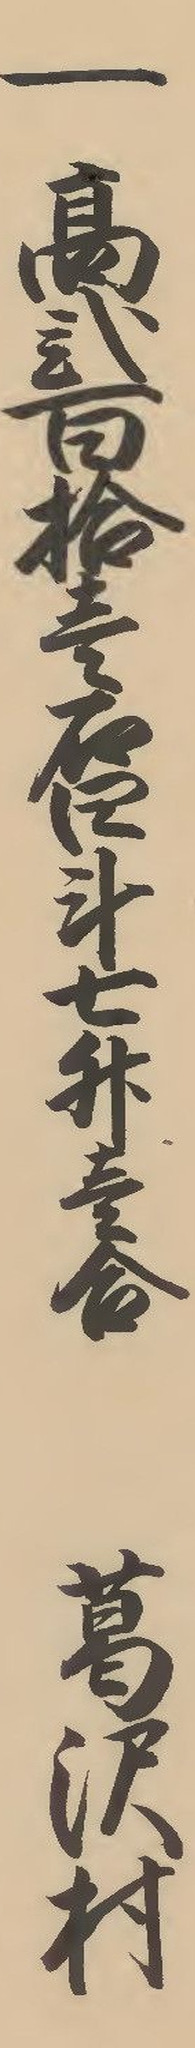一高弐百拾壱石四斗七升壱合葛沢村
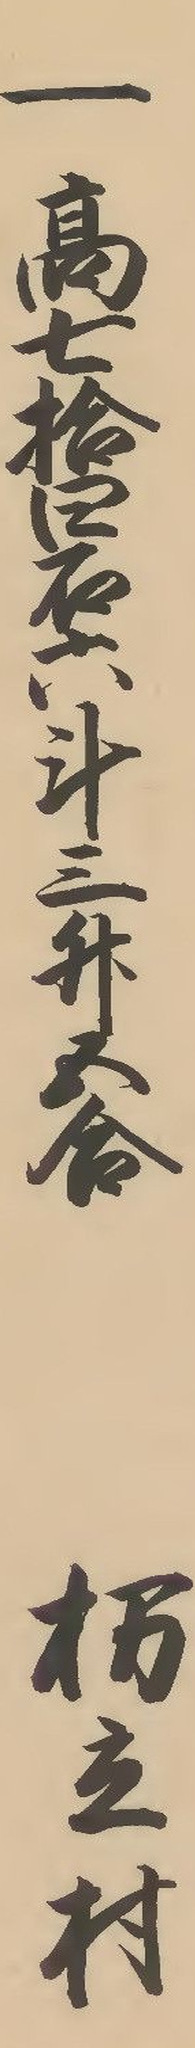一高七拾四石六斗三升五合栃立村

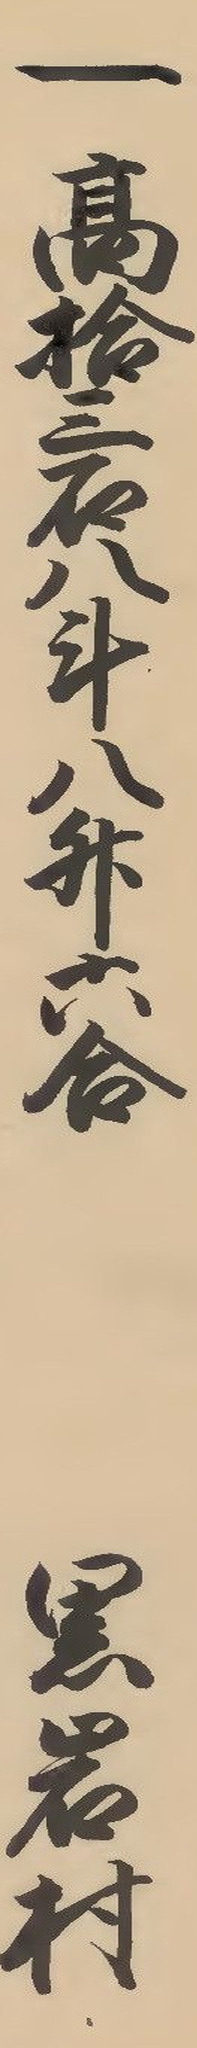一高拾三石八斗八升六合黒岩村
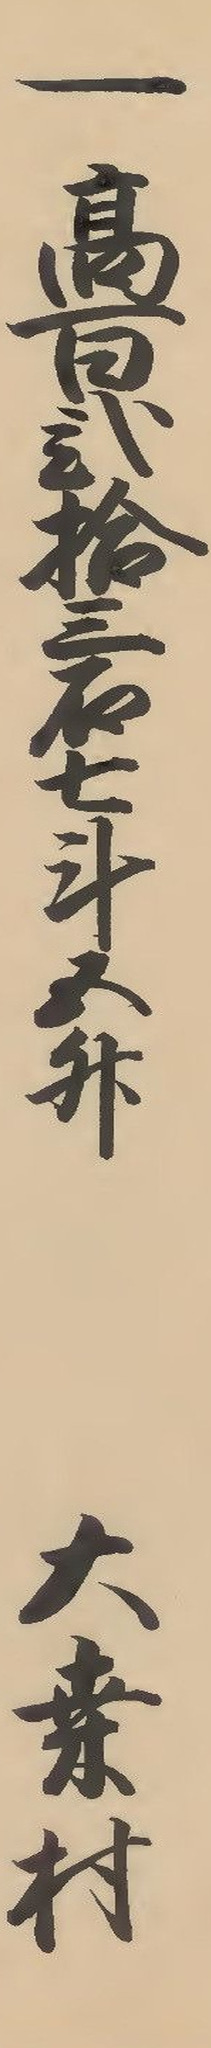一高百弐拾三石七斗五升大桑村
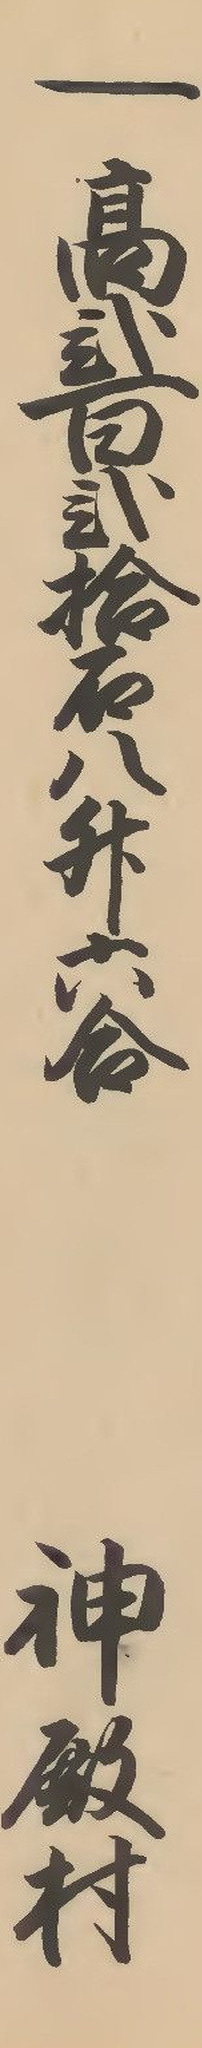一高弐百弐拾石八升六合神殿村
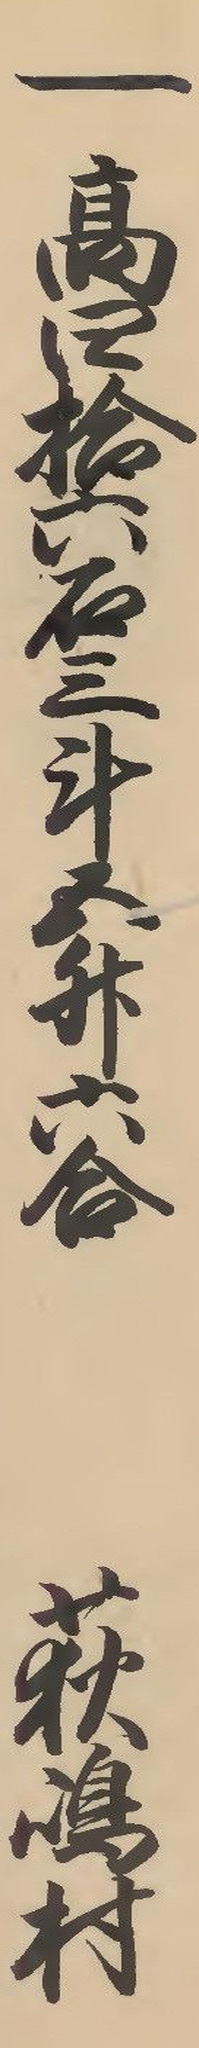一高四拾六石三斗五升六合荻島村
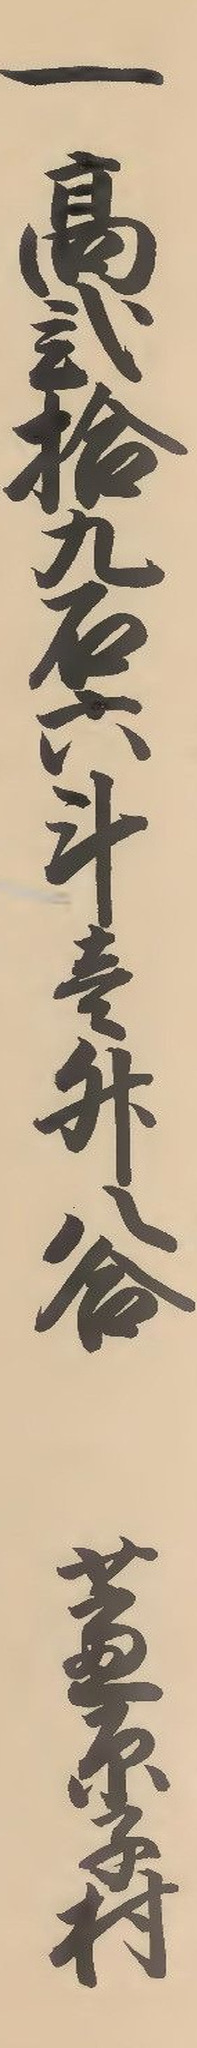一高弐拾九石六斗壱升八合蘆原子村
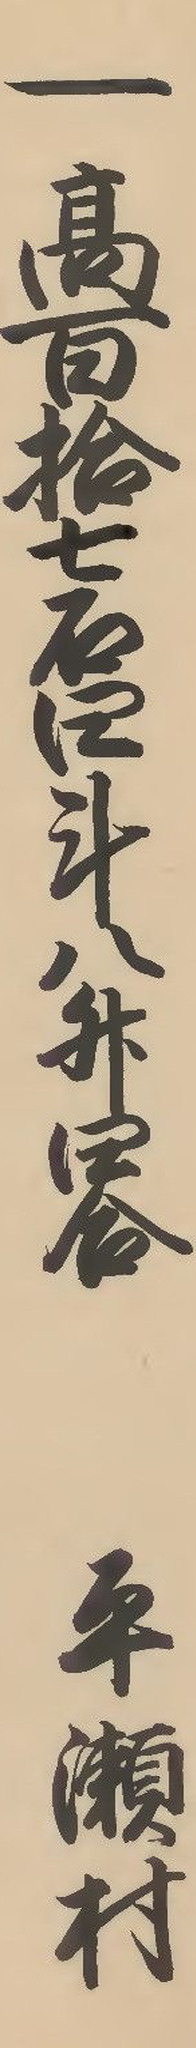一高百拾七石四斗八升四合平瀬村
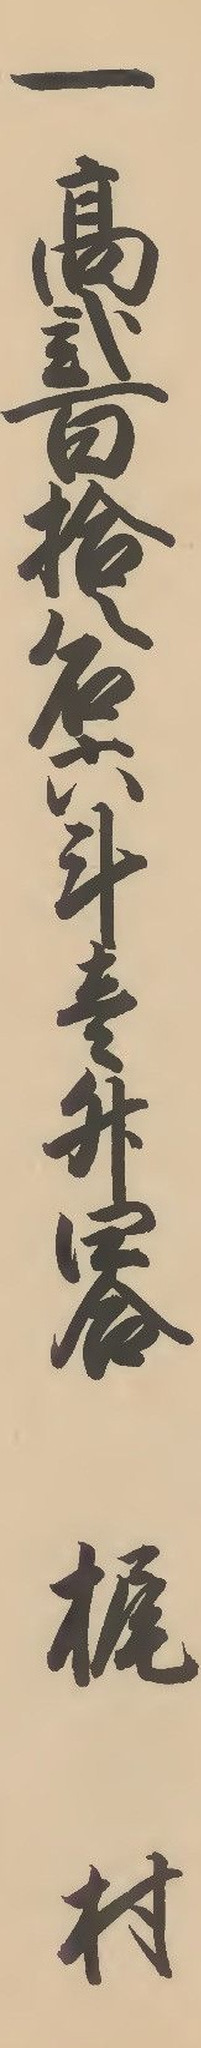一高弐百拾八石六斗壱升四合梶村
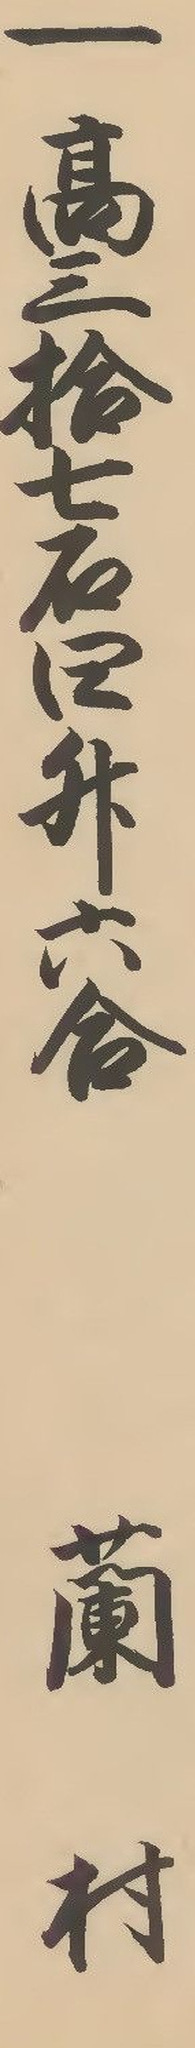一高三拾七石四升六合蘭村

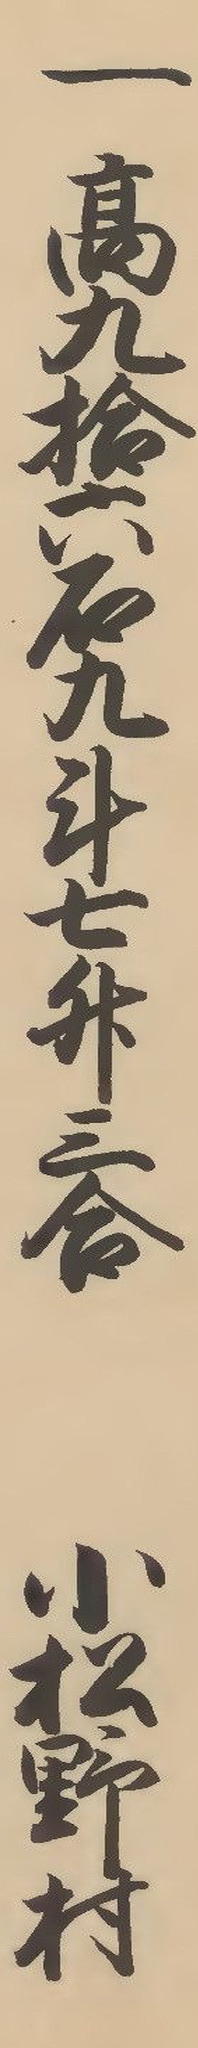一高九拾六石九斗七升三合小松野村
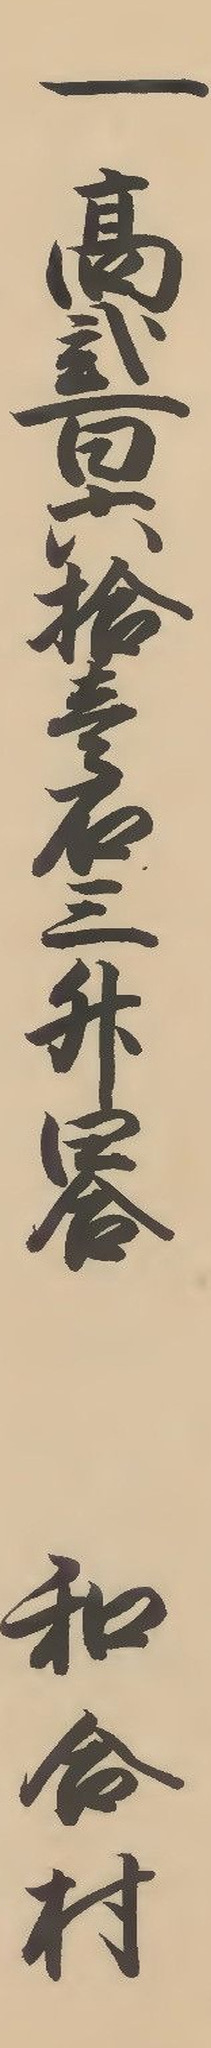一高弐百六拾壱石三升四合和合村
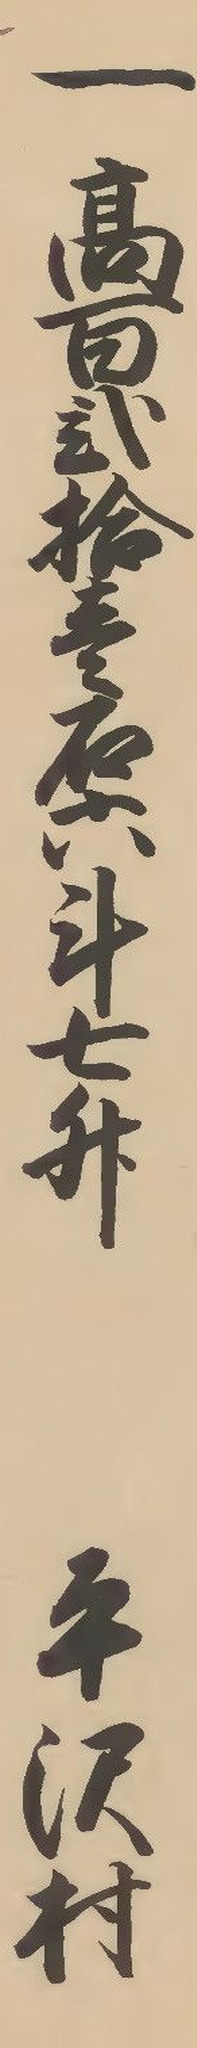一高百弐拾壱石六斗七升平沢村
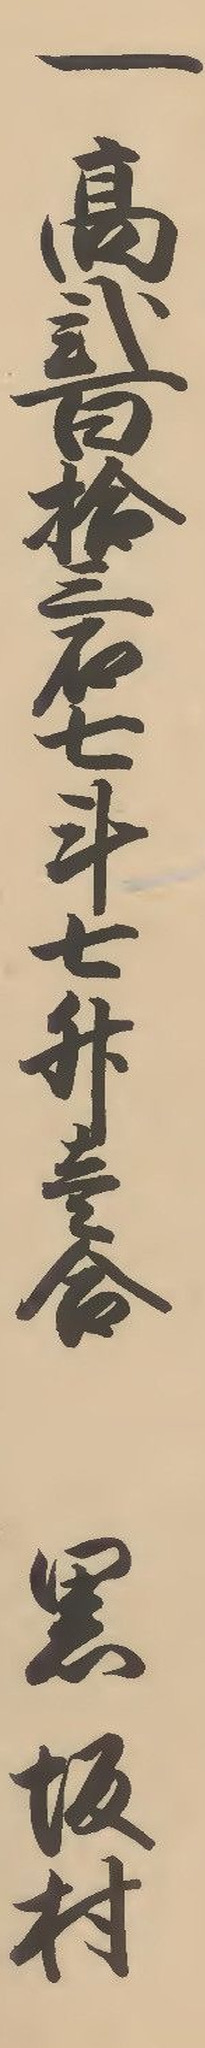一高弐百拾三石七斗七升壱合黒坂村
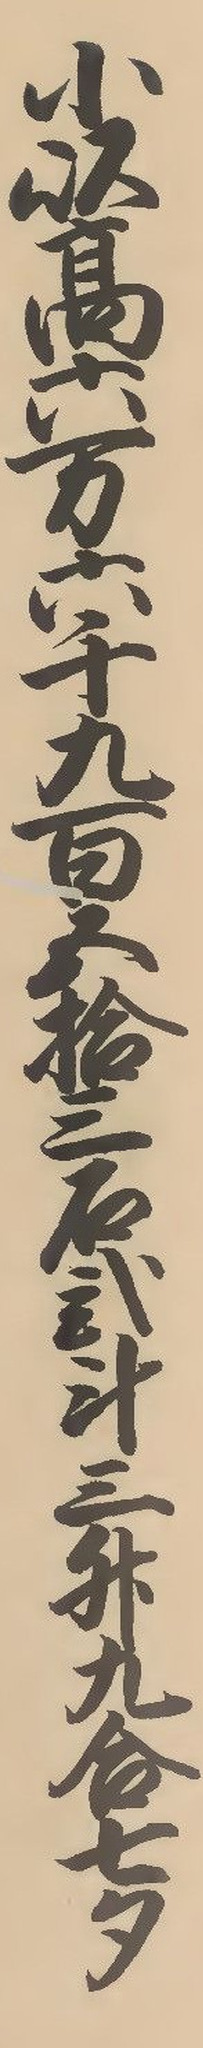小以高六万六千九百五拾三石弐斗三升九合七勺
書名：三河国郷帳
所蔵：国立公文書館 National Archives of Japan
